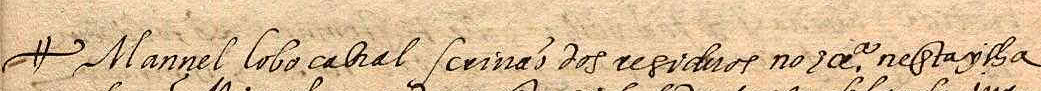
item Manuel lobo cabral scriuaõ dos residuos no Eccco nesta ylha
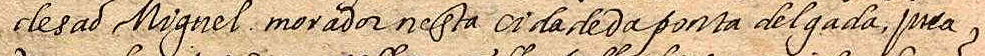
de saõ Miguel morador nesta cidade da ponta delgada, jura
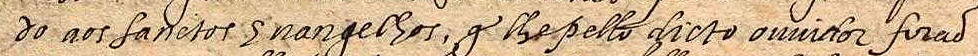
do aos Sanctos Euangelhos, q̅ lhe pello dicto ouuidor foraõ
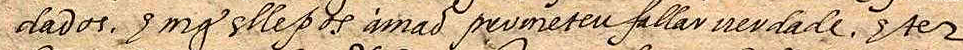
dados. Em q̄ Elle pos a maõ prometeu fallar uerdade. E ter
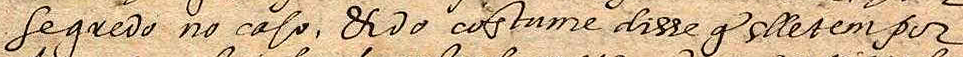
segredo no caso, & do costume disse q̄ Elle tem por
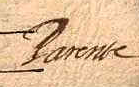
Parente
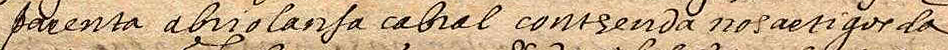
parenta a briolanja cabral contheuda nos artigos da
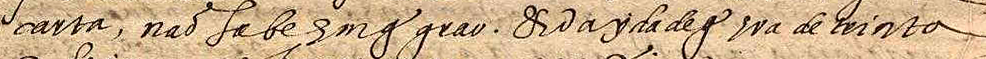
carta, naõ sabe Em q̄ grao. & da ydade q̄ Era de trinta
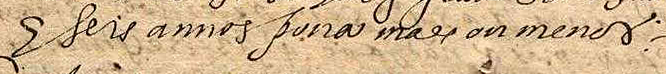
E seis annos pouco maes ou menos.
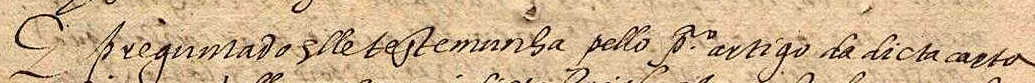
E preguntado Elle testemunha pello p.ro artigo da dicta carta
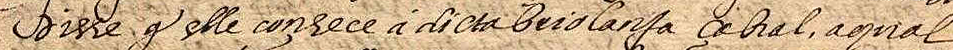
disse q̄ elle conhece a dicta briolanJa cabral, a qual
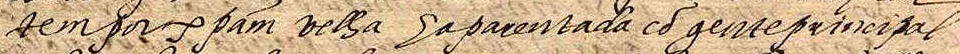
tem por xpām velha E aparentada cō gente principal
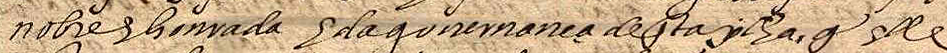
nobre E honrada E da gouernança desta ylha, q̄ Elle
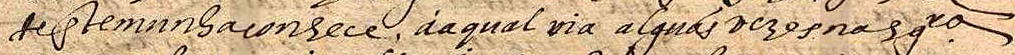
testemunha conhece, àa qual via alguās vezes na Egra.
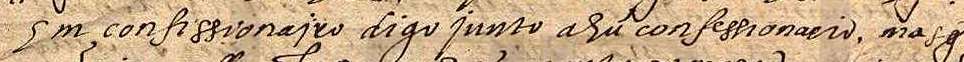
Em confissionajro digo junto a hū confessionario, mas q̄
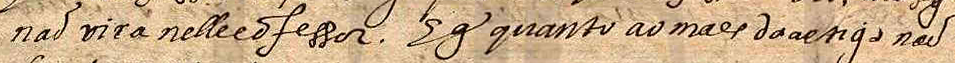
naõ vira nelle cōfessor. E q̄ quanto ao maes do artigo naõ
